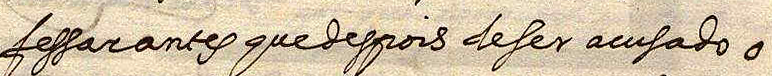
fessar antes que despois de ser acusado o
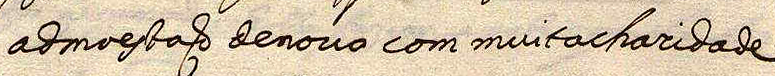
admoestaõ de nouo com muita charidade
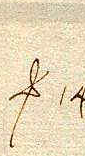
ser 14
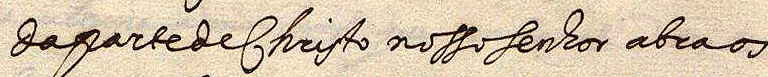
da parte de Christo nosso Senhor abra os
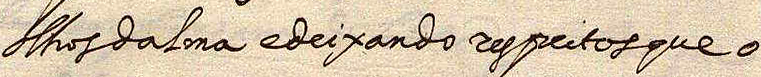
olhos dalma e deixando respeitos que o
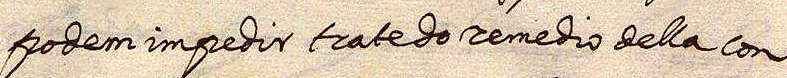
podem impedir trate do remedio della con
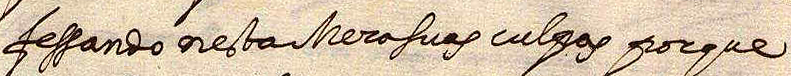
fessando nesta Meza suas culpas porque
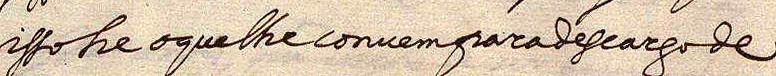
isso he o que lhe conuem para descargo de
